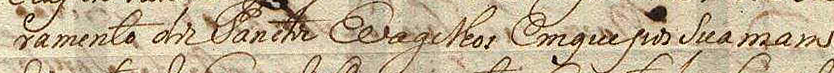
ramento dos Sanctos Evagelhos Em que pos sua mam
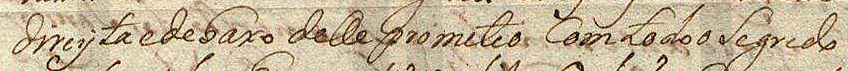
direyta e debaxo delle prometeo Com todo o segredo
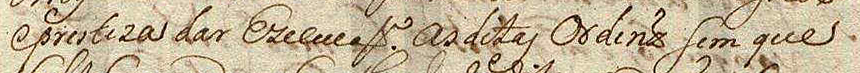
e presteza dar Ezecuçaõ. As ditas Ordenz̄ sem que
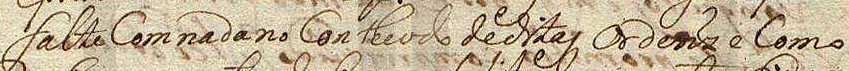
falte Com nada no Contheodo de ditas Ordenz̄, e Como
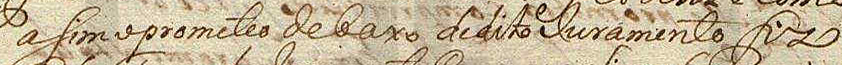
asim o prometeo debaxo de dito Iuramento fiz
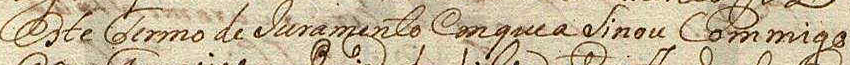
Este Termo de Iuramento Em que asinou Commigo
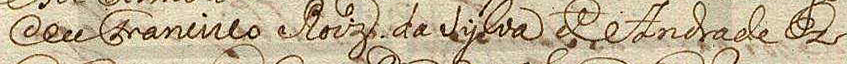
E eu Francisco Roiz̄ da Sylva d̄ Andrade Ez
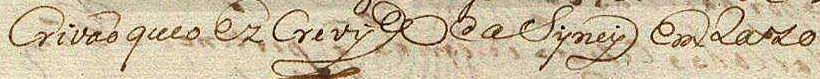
Crivão que o EzCrevy e aSyney em Raza
